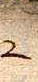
2
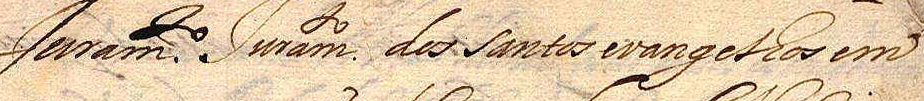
Juram.to Iuram.to dos santos evangelhos em
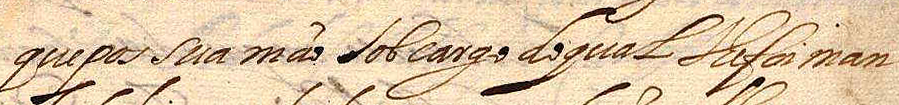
que pos sua mão sob cargo do qual lhe foi man
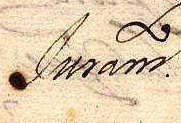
Iuram.to
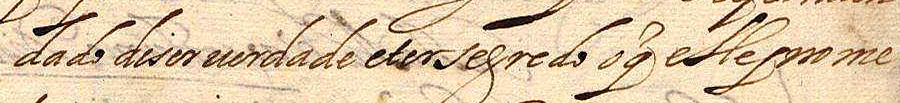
dado diser uerdade e ter segredo o q̄ elle prome
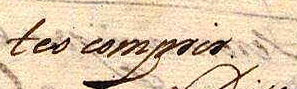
teo comprir.
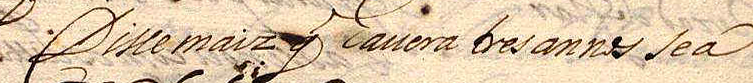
Disse maiz q̄ hauera tres annos se a
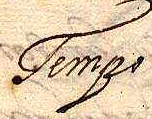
Tempo
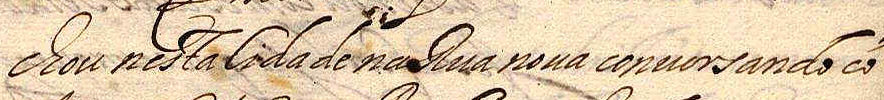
chou nesta Cidade na Rua noua conuersando cō
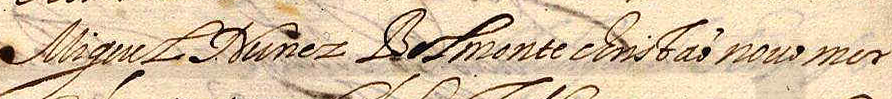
Miguel Nunez Belmonte christaõ nouo mer
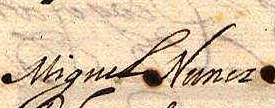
Miguel Nunez
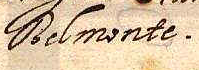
Belmonte.
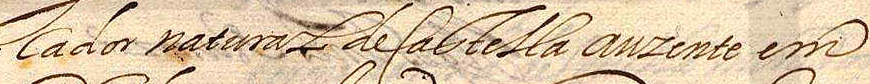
cador natural de Castella auzente em
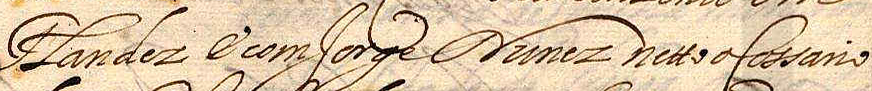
Flandez, e com Jorge Nunez netto Cossario
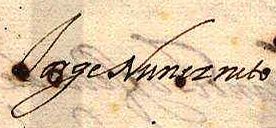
Iorge Nunez neto
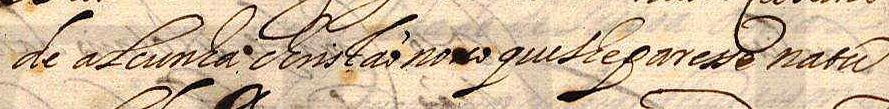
de alcunha christaõ nouo que lhe paresse natu
